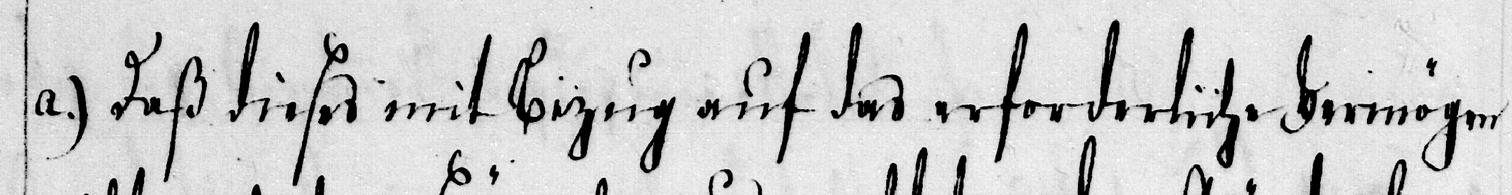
a.) Daß dieses mit Bezug auf das erforderliche Vermögen
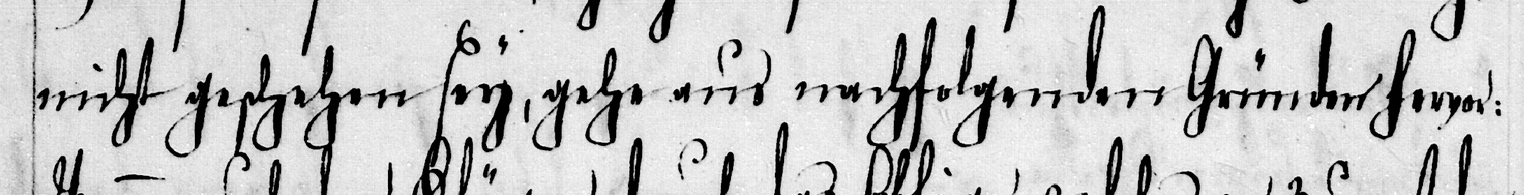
nicht geschehen sey, gehe aus nachfolgenden Gründen hervor:
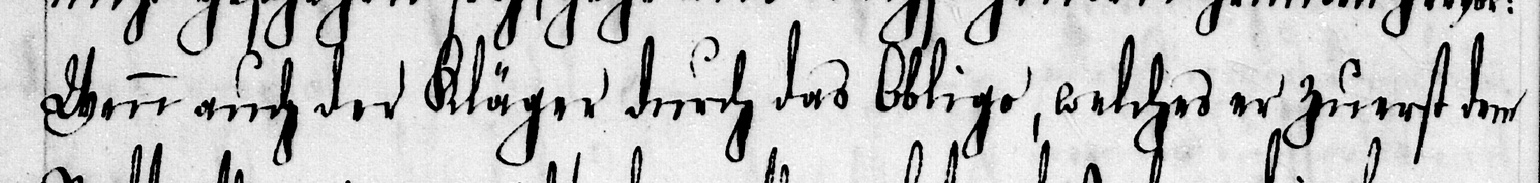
Wenn auch der Kläger durch das Obligo, welches er zuerst dem
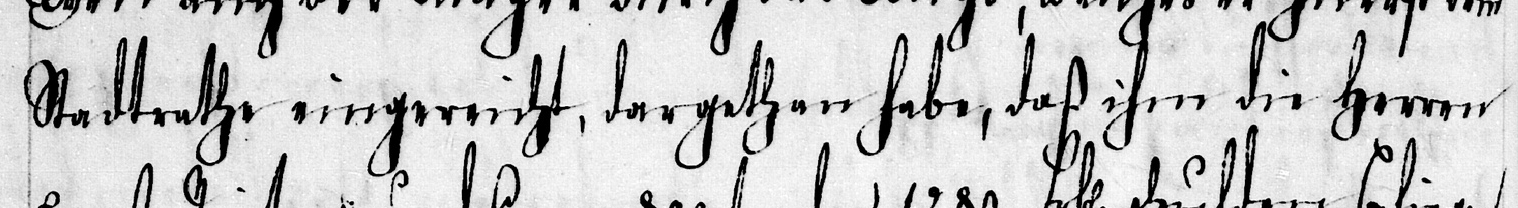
Stadtrathe eingereicht, dargethan habe, daß ihm die Herren
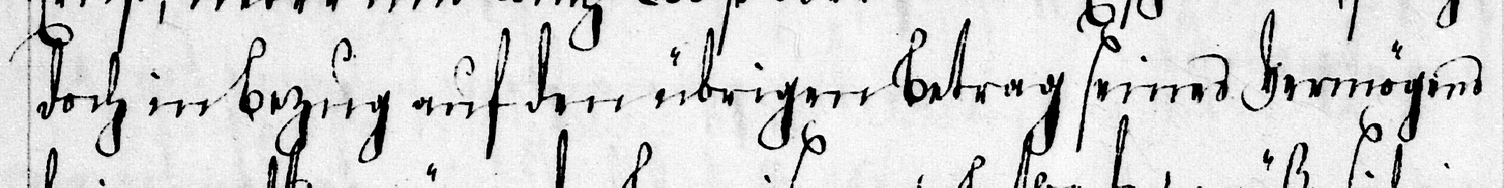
doch in Bezug auf den übrigen Betrag seines Vermögens
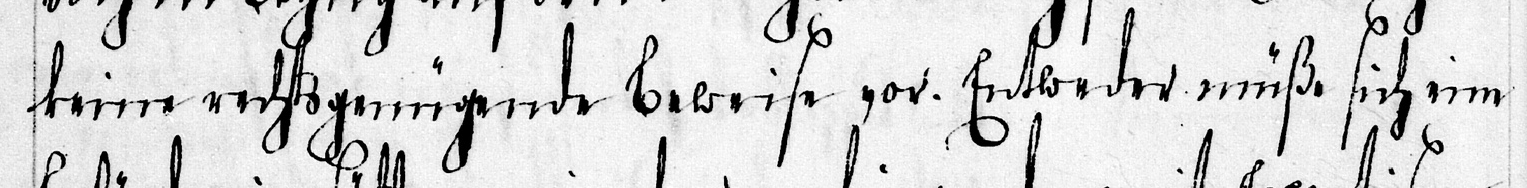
keine rechtsgenügende Beweise vor. Entweder müße sich eine
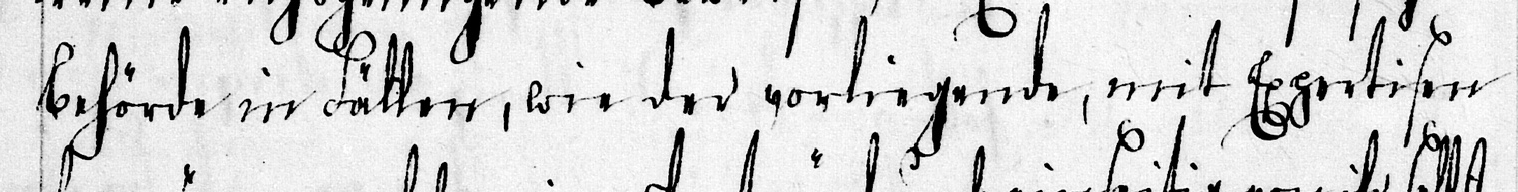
Behörde in Fällen, wie der vorliegende, mit Expertisen
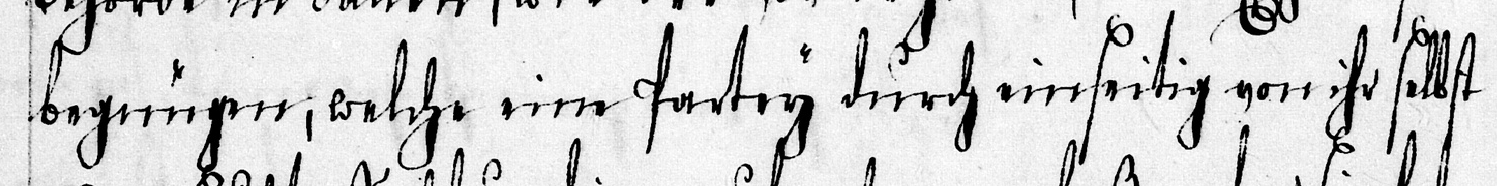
begnügen, welche eine Partey durch einseitig von ihr selbst
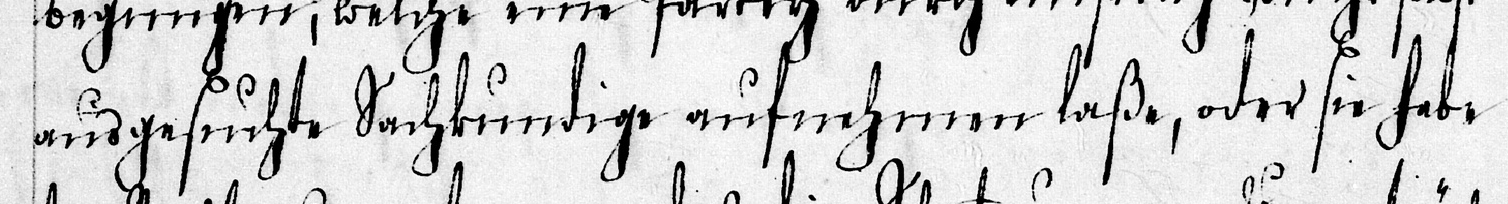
ausgesuchte Sachkundige aufnehmen laße, oder sie habe
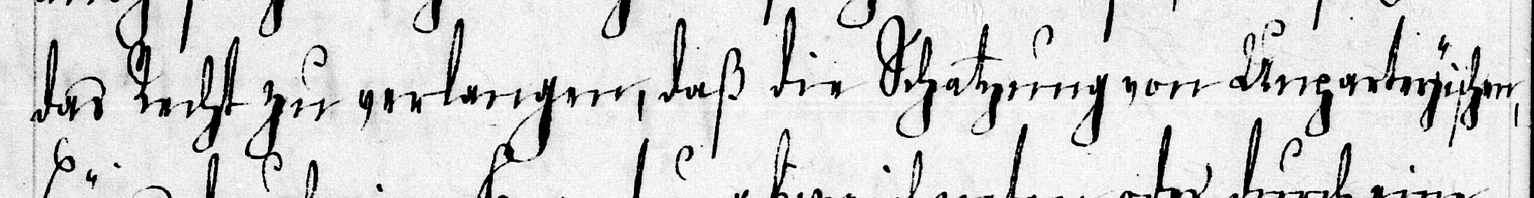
das Recht zu verlangen, daß die Schatzung von Unparteyischen,
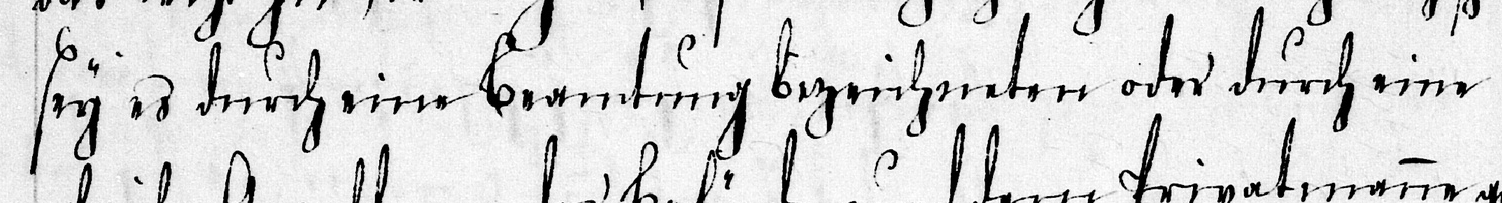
sey es durch eine Beamtung bezeichneten oder durch eine
